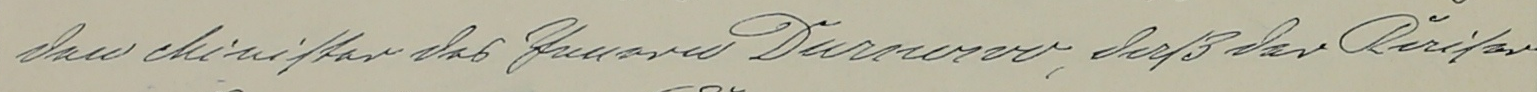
den Minister des Innern Durnowo, daß der Kaiser
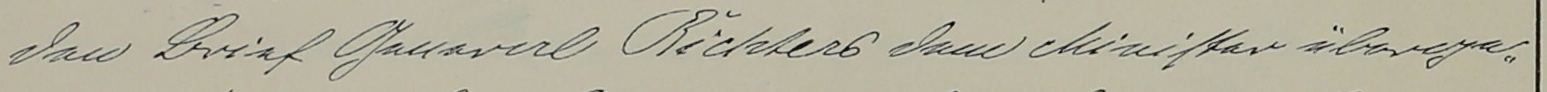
den Brief General Richters dem Minister überge-
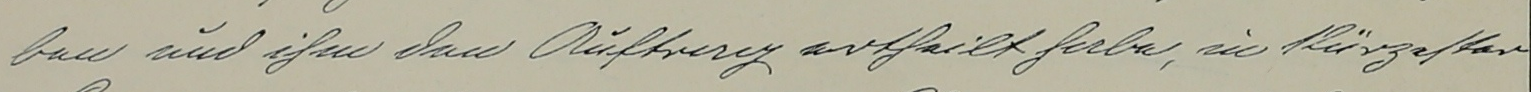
ben und ihm den Auftrag ertheilt habe, in kürzester
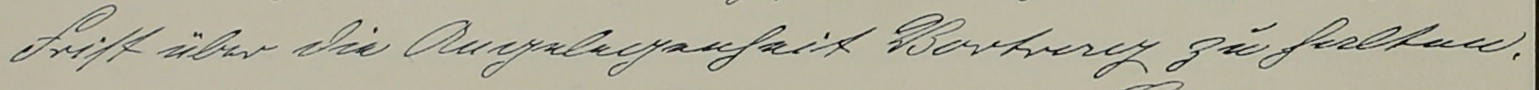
Frist über die Angelegenheit Vortrag zu halten.
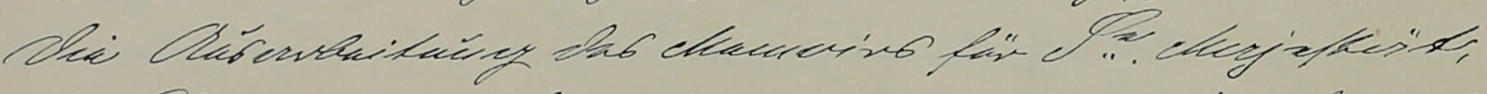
Die Ausarbeitung des Memoirs für Se. Majestät,
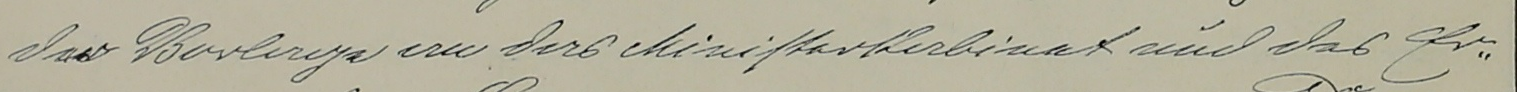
der Vorlage an das Ministerkabinett und des Er-
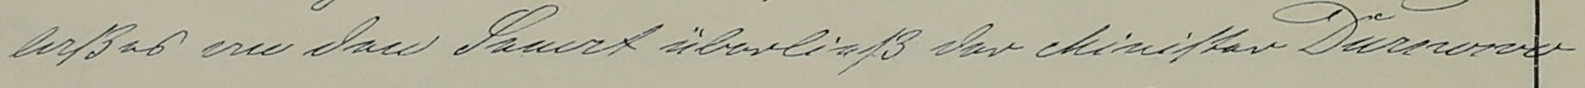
laßes an den Senat überließ der Minister Durnowo
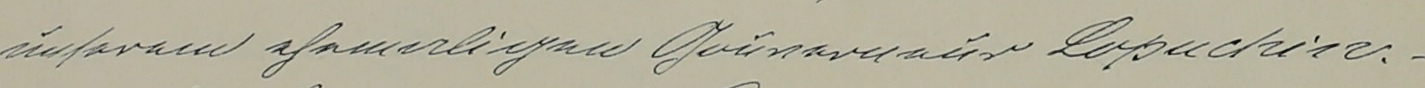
unserem ehemaligen Gouverneur Lopuchin.
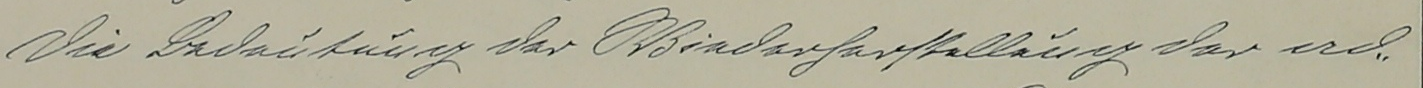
Die Bedeutung der Wiederherstellung der ad-
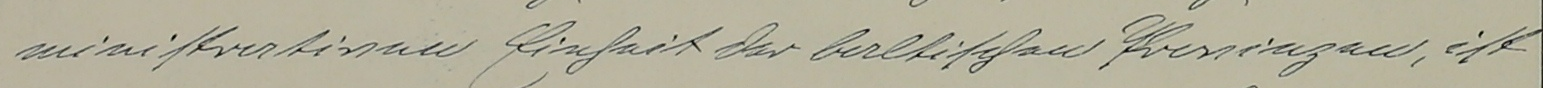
ministrativen Einheit der baltischen Provinzen, ist
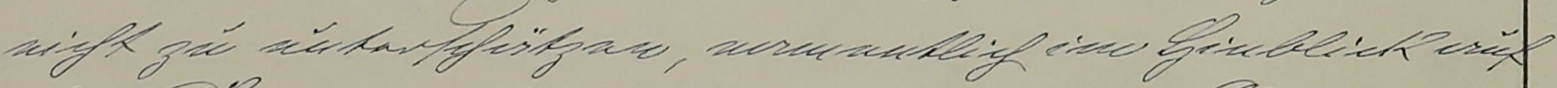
nicht zu unterschätzen, namentlich im Hinblick auf
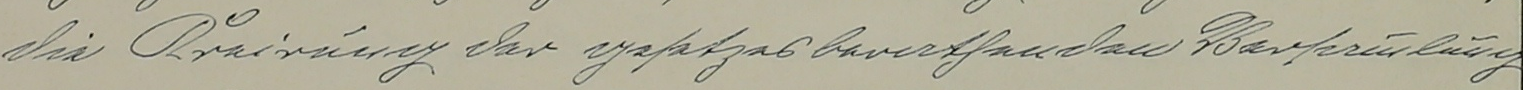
die Kreierung der gesetzesberathenden Versammlung
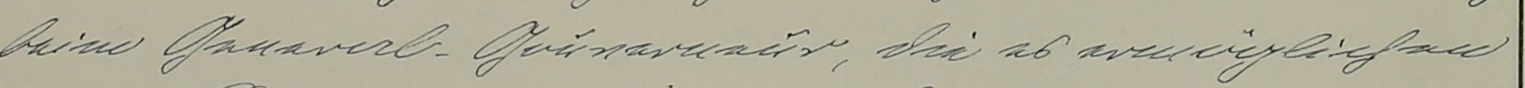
beim General-Gouverneur, die es ermöglichen
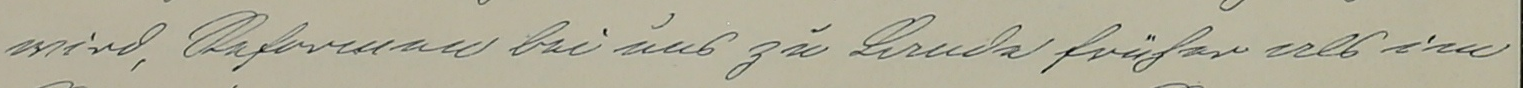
wird, Reformen bei uns zu Lande früher als im
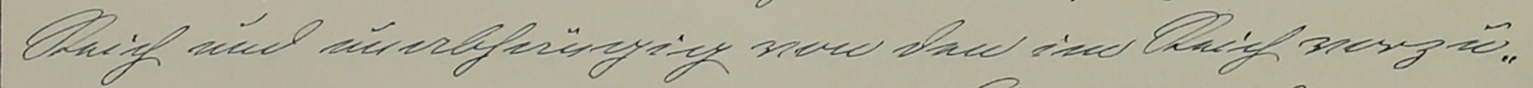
Reich und unabhängig von den im Reich vorzu-
